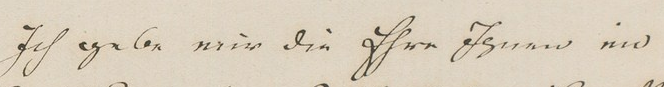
Ich gebe mir die Ehre Ihnen im
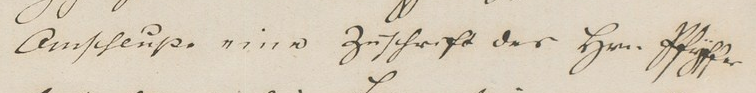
Anschluße eine Zuschrift des Hrn. Pfyffer
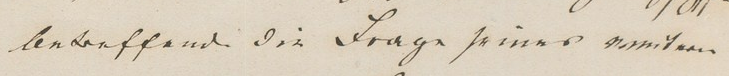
betreffend die Frage seines weitern
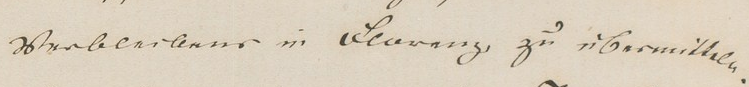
Verbleibens in Florenz zu übermitteln.
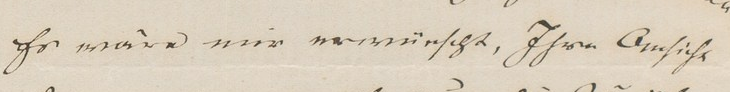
Es wäre mir erwünscht, Ihre Ansicht
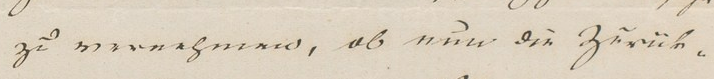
zu vernehmen, ob nun die Zurük-
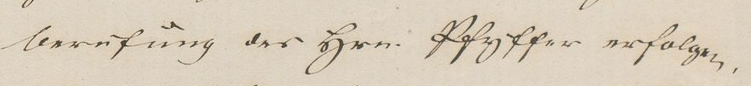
berufung des Hrn. Pfyffer erfolgen,
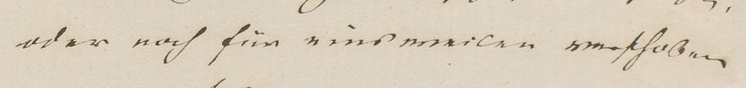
oder noch für einsweilen verschoben
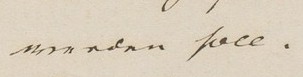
werden soll.
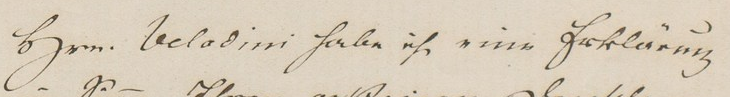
Hrn. Veladini habe ich eine Erklärung
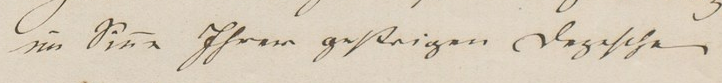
im Sinne Ihrer gestrigen Depesche
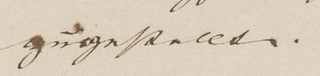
zugestellt.
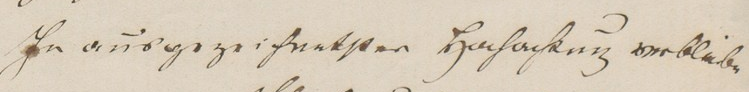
In ausgezeichnetster Hochachtung verbleibe
